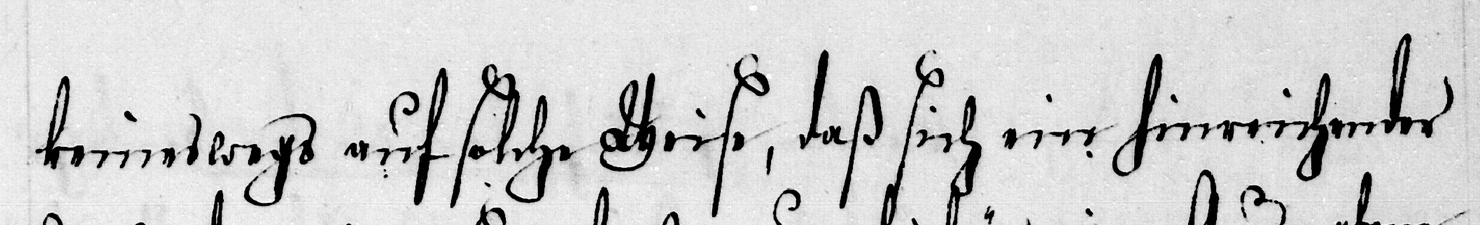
keineswegs auf solche Weise, daß sich ein hinreichender
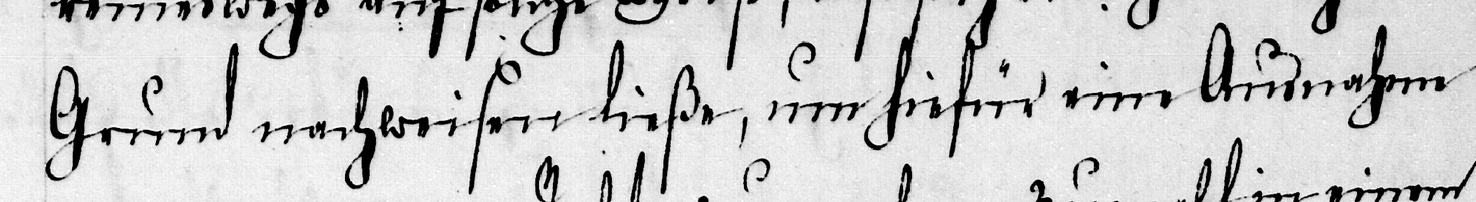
Grund nachweisen ließe, um hiefür eine Ausnahme
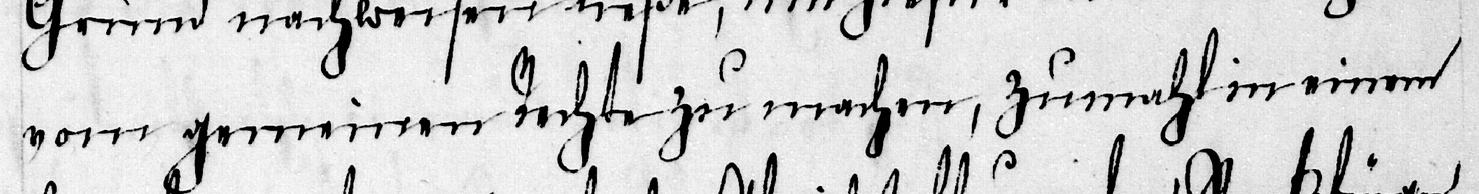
vom gemeinen Rechte zu machen, zumahl in einem
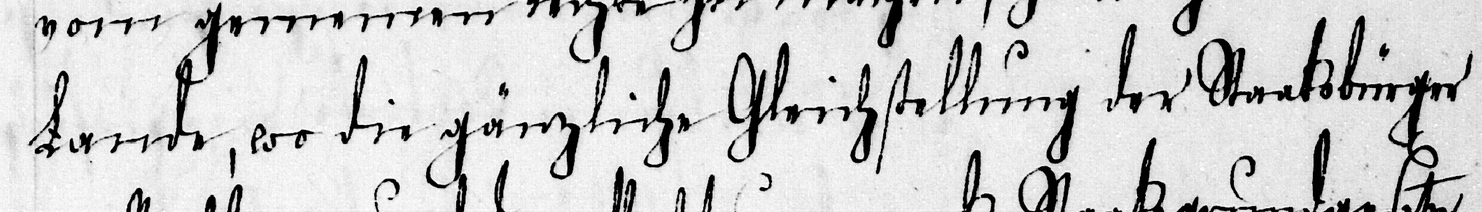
Lande, wo die gänzliche Gleichstellung der Staatsbürger
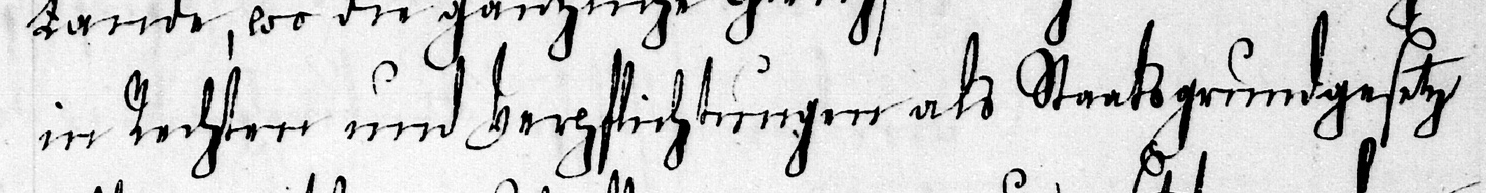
in Rechten und Verpflichtungen als Staatsgrundgesetz
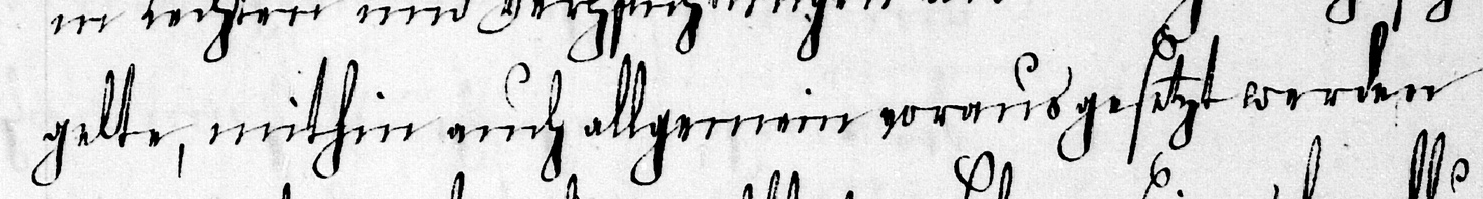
gelte, mithin auch allgemein vorausgesetzt werden
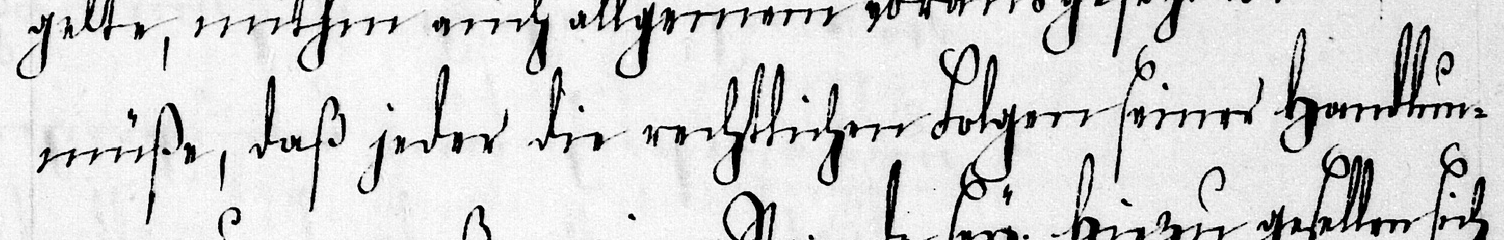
müße, daß jeder die rechtlichen Folgen seiner Handlun¬
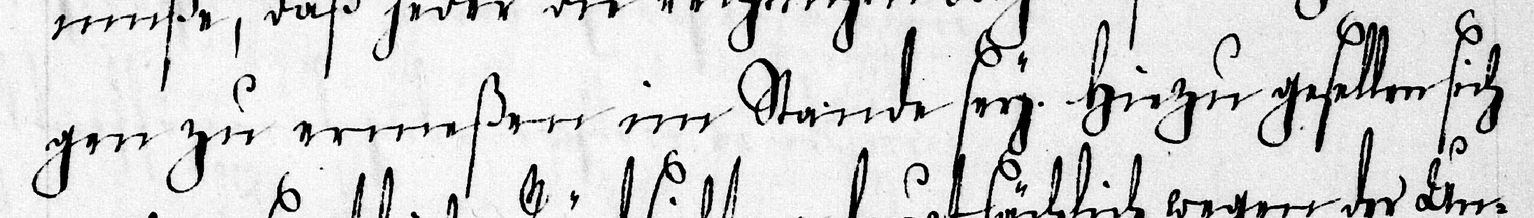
gen zu ermeßen im Stande sey. Hiezu gesellen sich
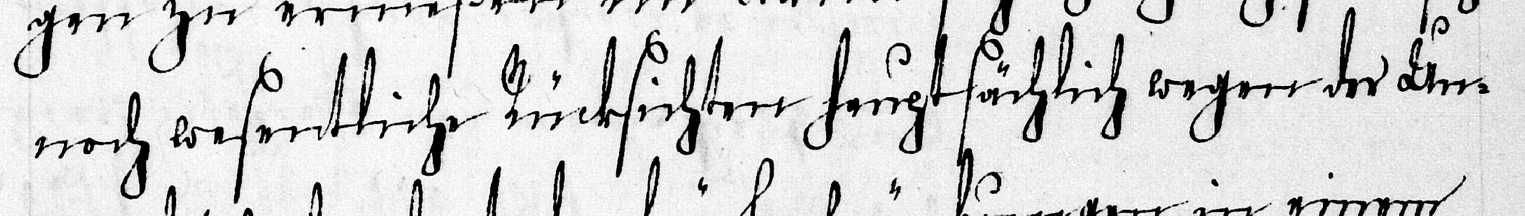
noch wesentliche Rücksichten hauptsächlich wegen der Un¬
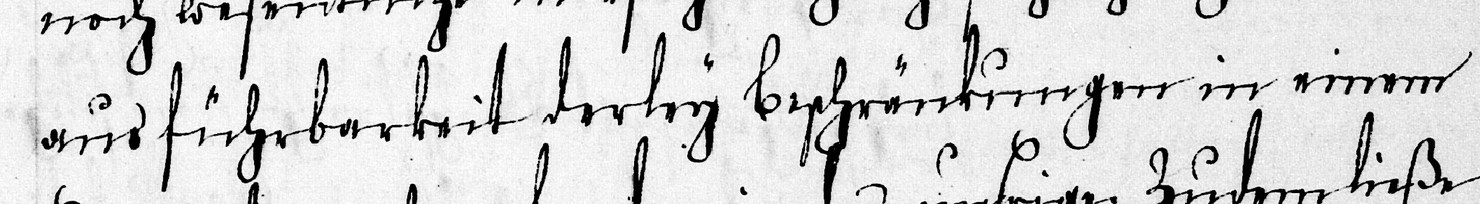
ausführbarkeit derley Beschränkungen in einem
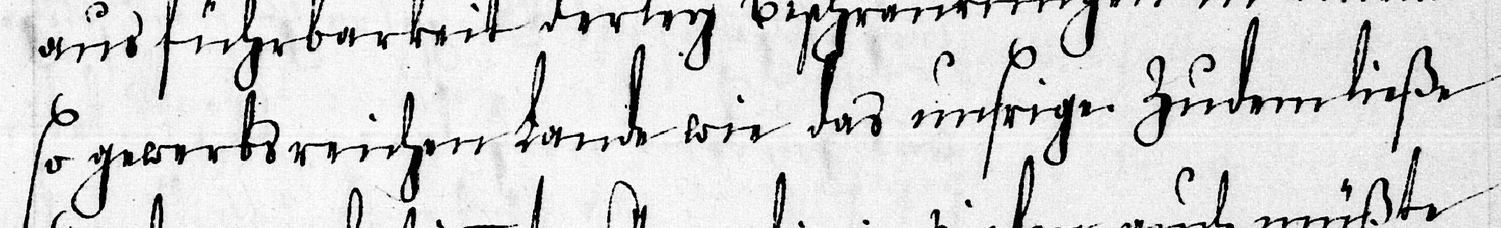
so gewerbsreichen Lande wie das unsrige. Zudem ließe
